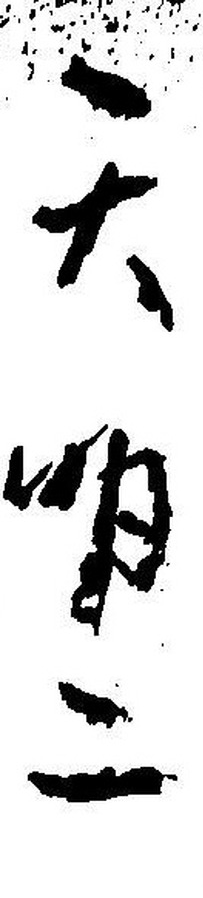天明二
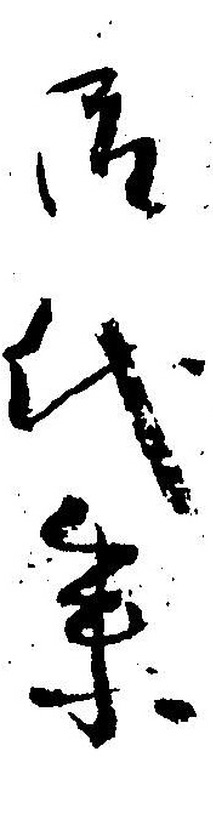御代参

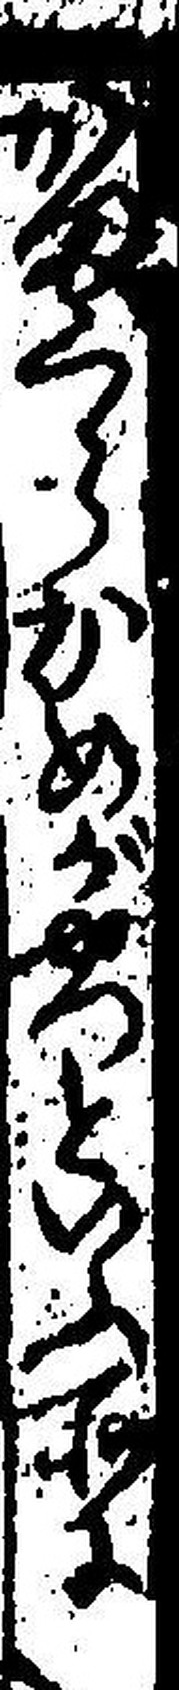かまくらかめがやつといふ所に
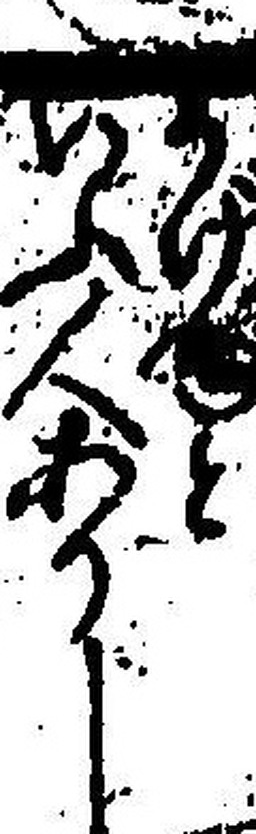いふ人あり
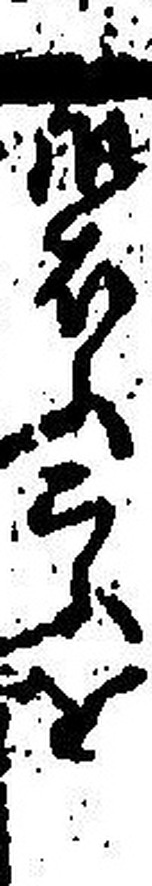御ほふこふを
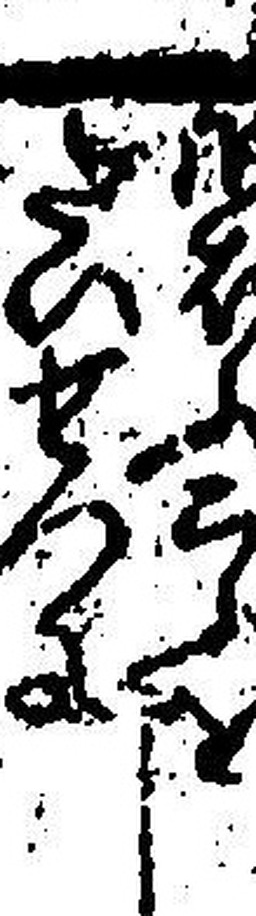たいせつに
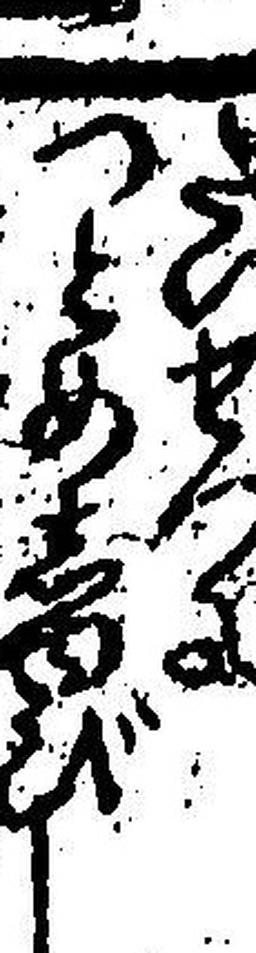つとめしゆび
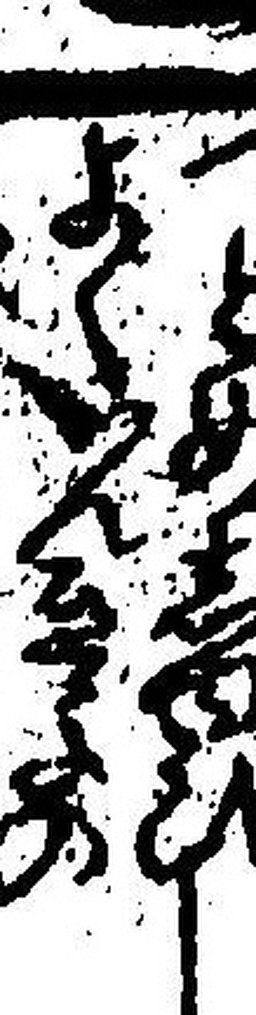よくいんきよの
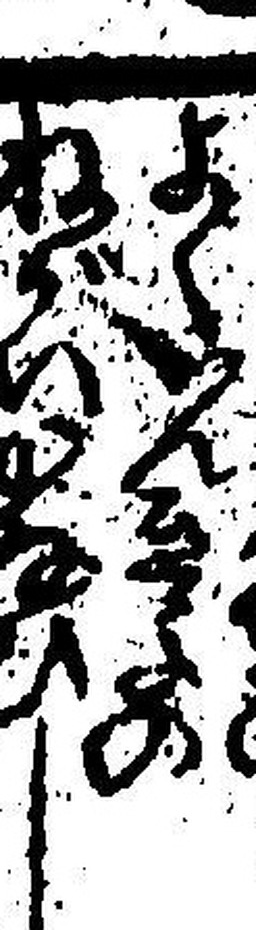ねがいかなひ
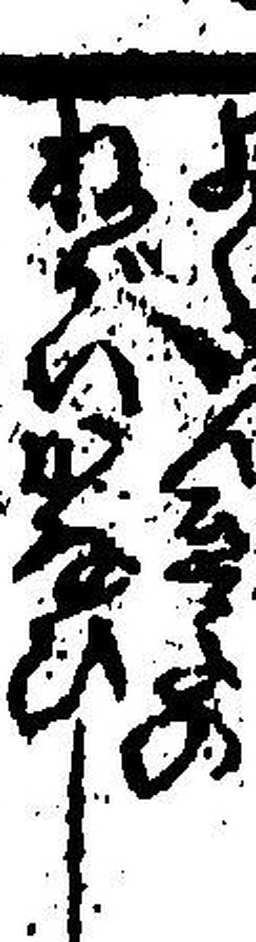ねがいかなひ
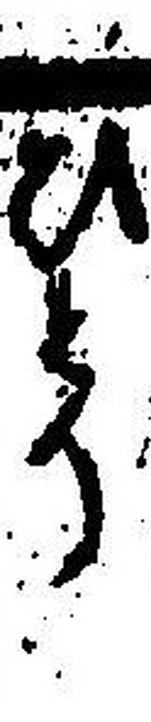ひとり
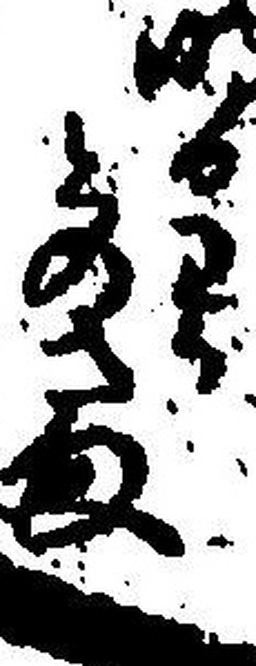とのさま
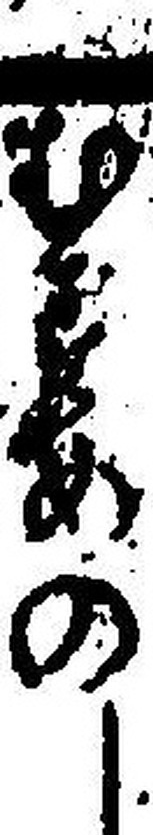むすめの
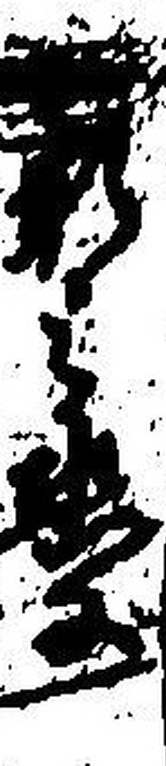新之丞に
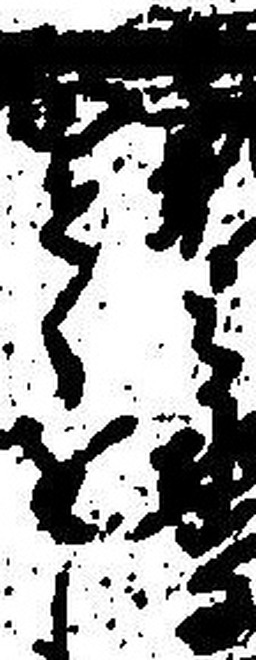かとくを
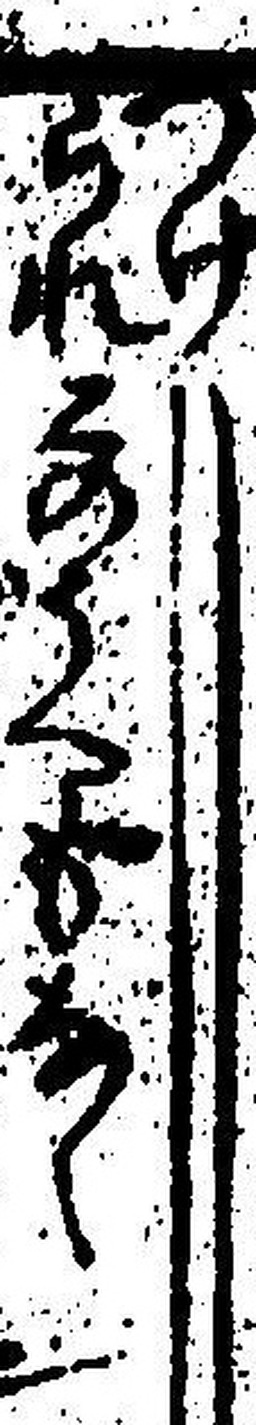られこのうへもなく
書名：御代参牛時詣 / 市場通笑作
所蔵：東京大学総合図書館 General Library in the University of Tokyo, JAPAN
